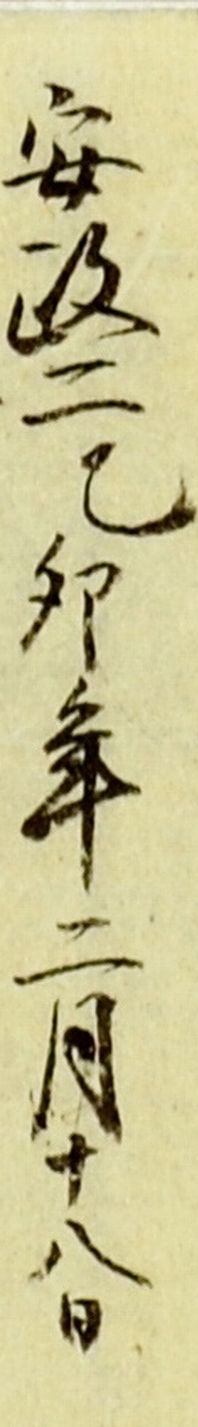安政二乙卯年二月十八日
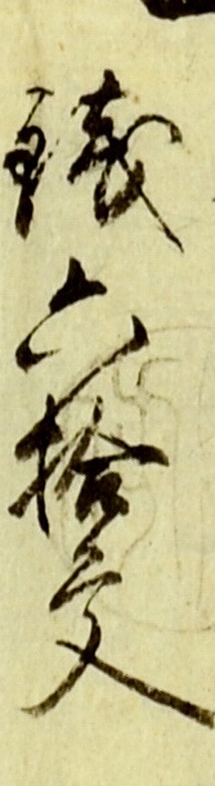銭六拾文
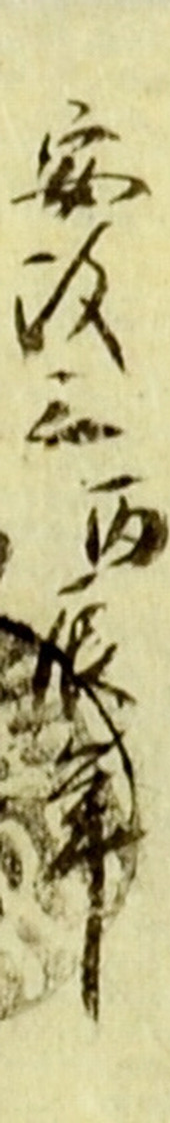安政三丙辰年
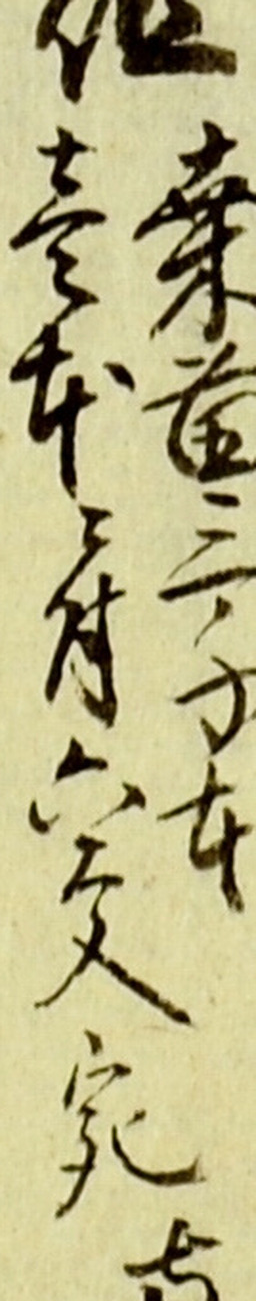壱本ニ付六文宛
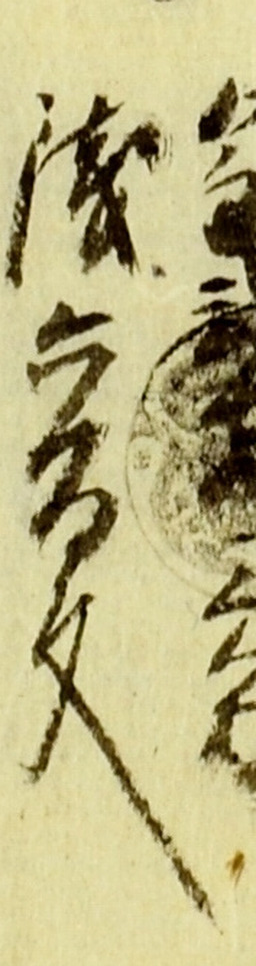銭六百文
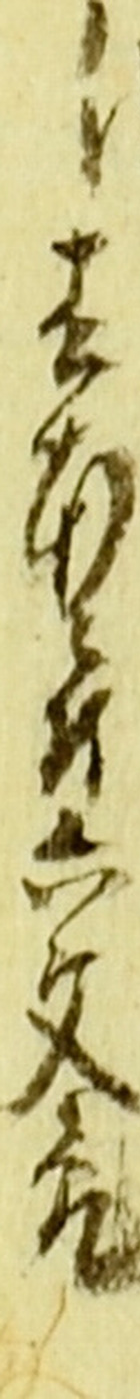壱本ニ付六文宛
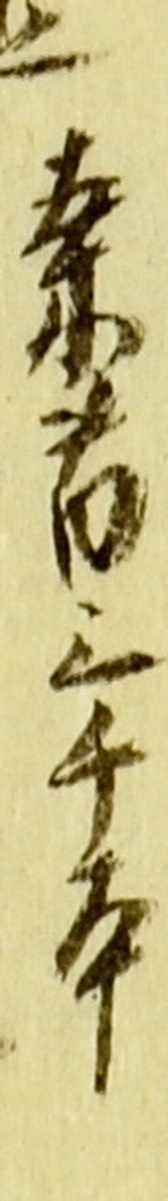但桑苗三千本
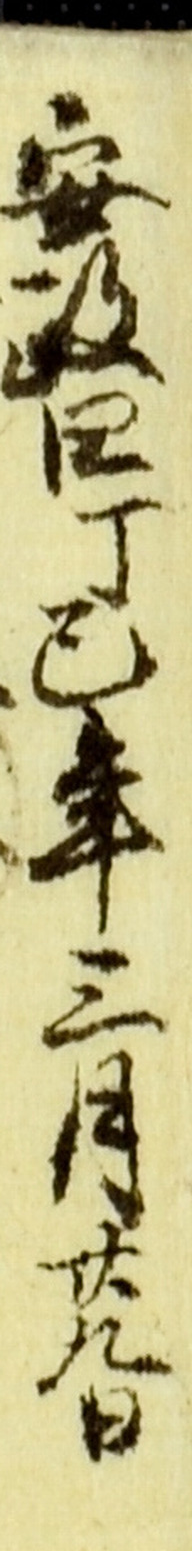安政四丁巳年三月廿九日
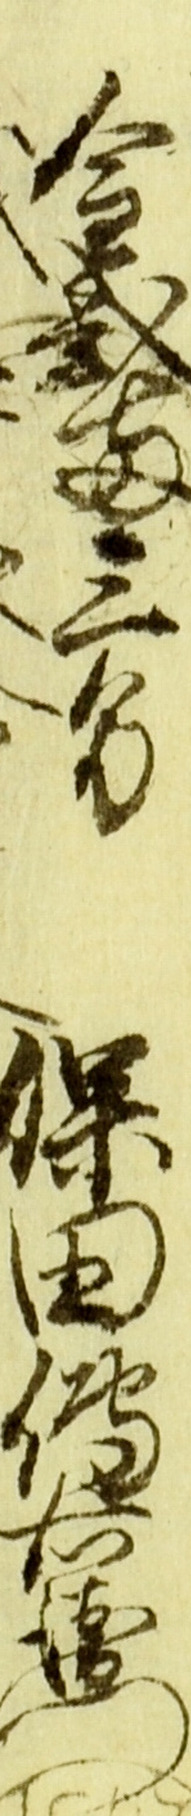一金弐両三分保田伝右衛門㊞
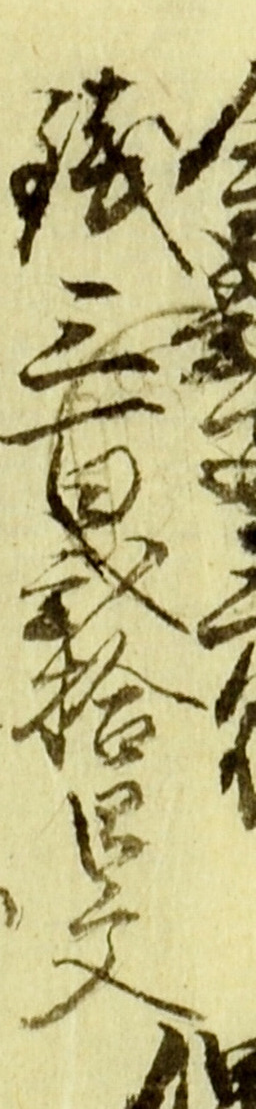銭三百弐拾四文
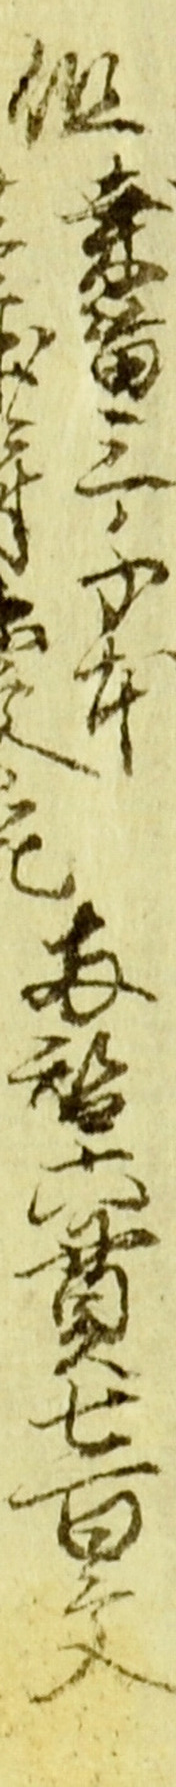但桑苗三千本両替六貫七百文
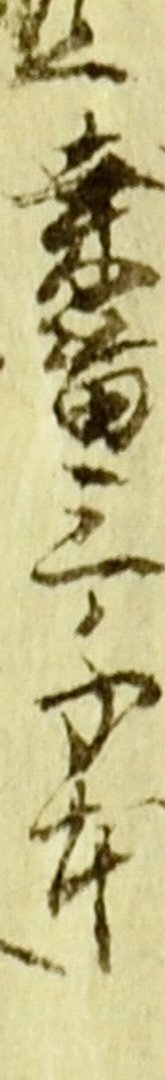但桑苗三千本
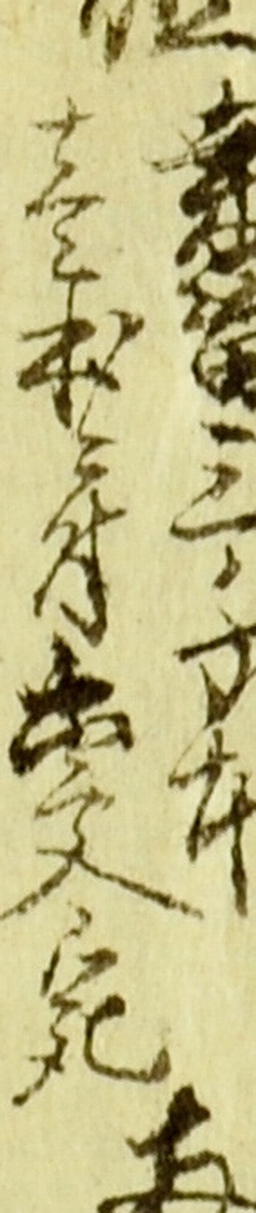壱本ニ付六文宛
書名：桑畑御入用金請取通
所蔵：伊那市立高遠町図書館・合同会社AMANE
